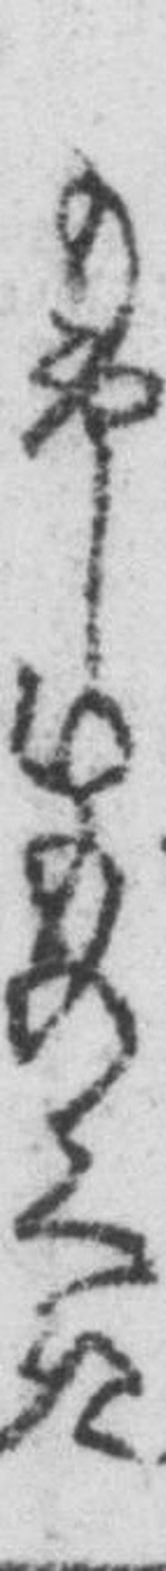もやしいものくき
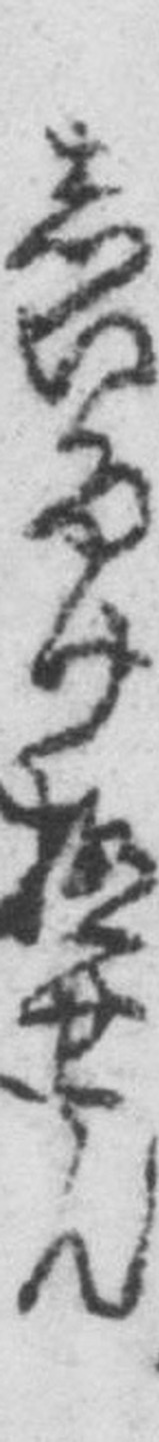しいたけ極せん
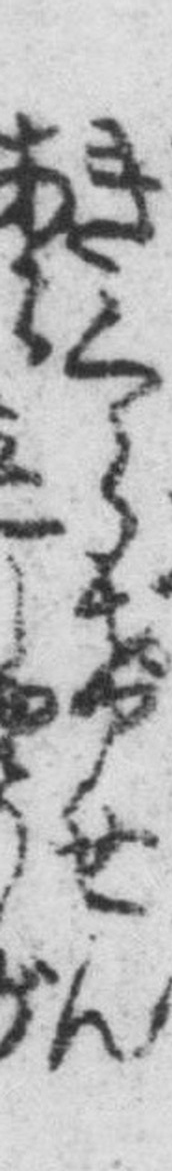あられしやうが
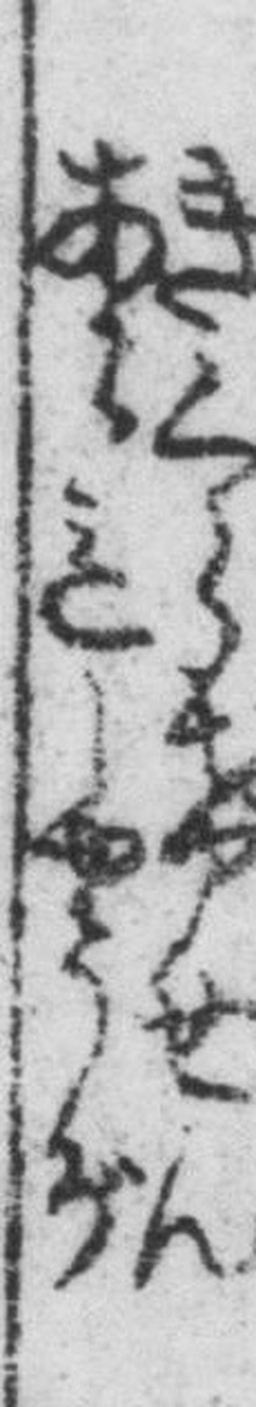あられしやうが
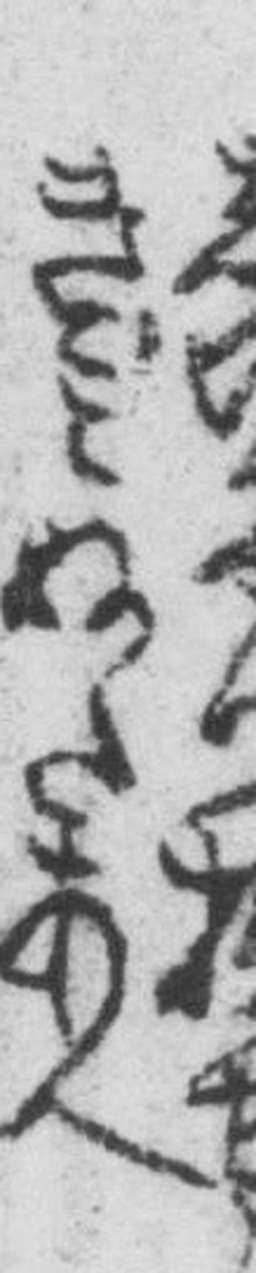きミぬきあへ
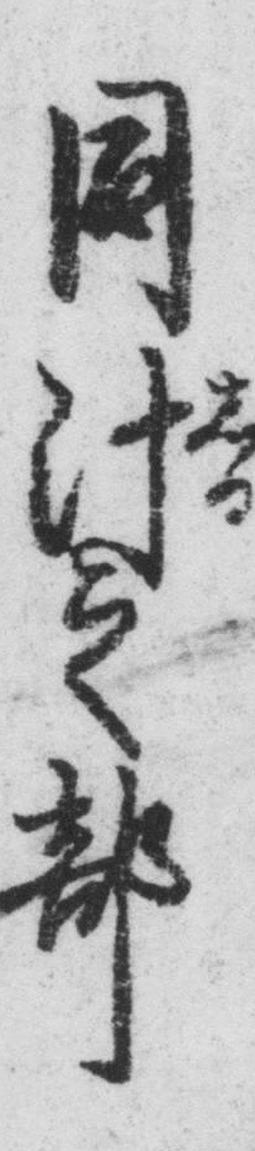同汁之部
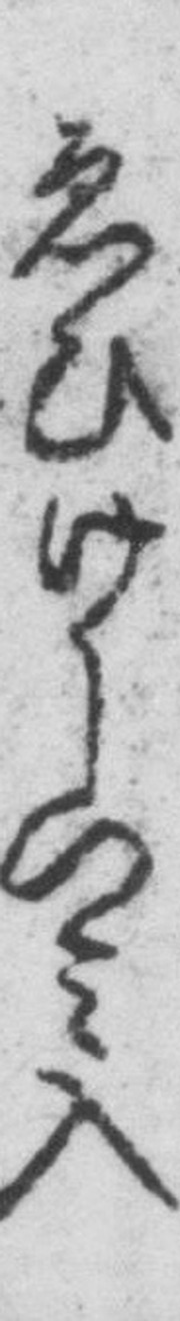ゑひけしのミ入
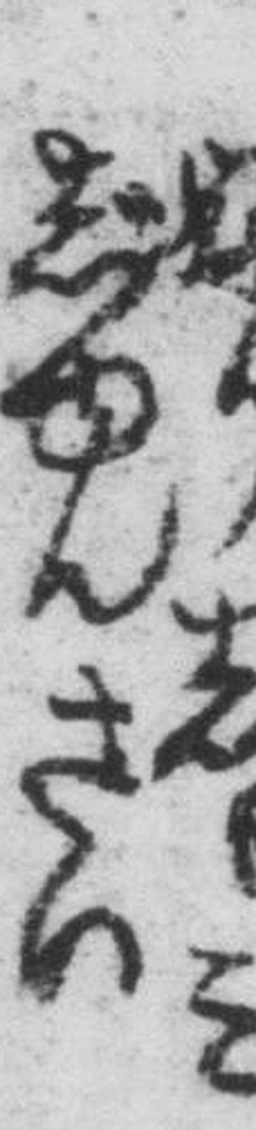じゆんさい
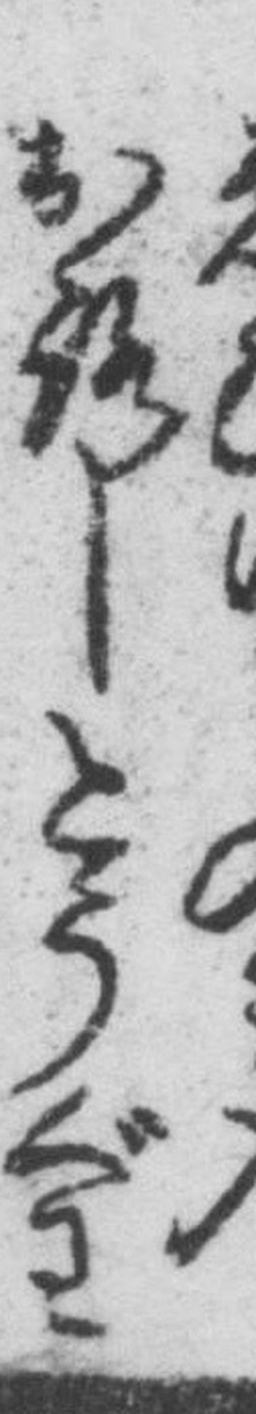おしとうぐわ
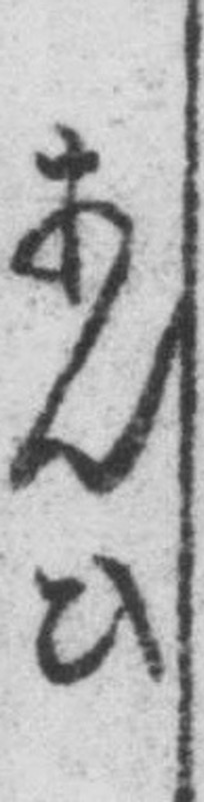あんひ
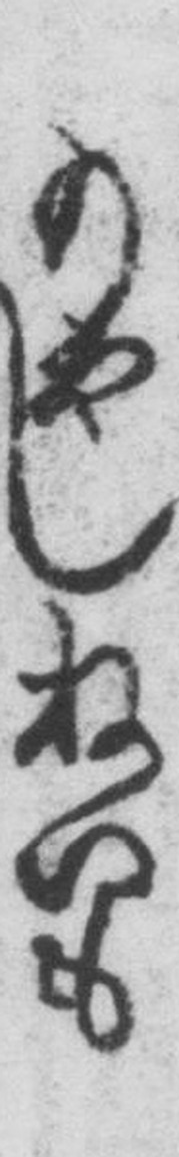もやしいも

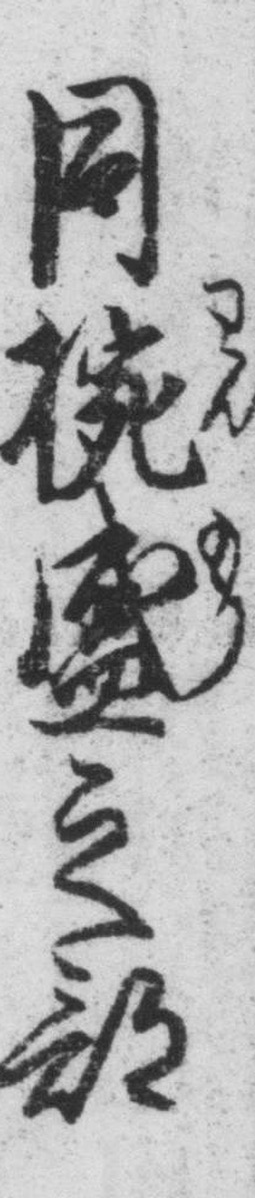同椀盛之部
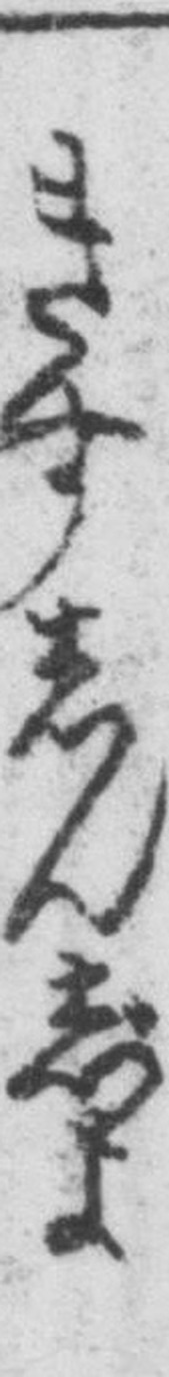きすしんじよ
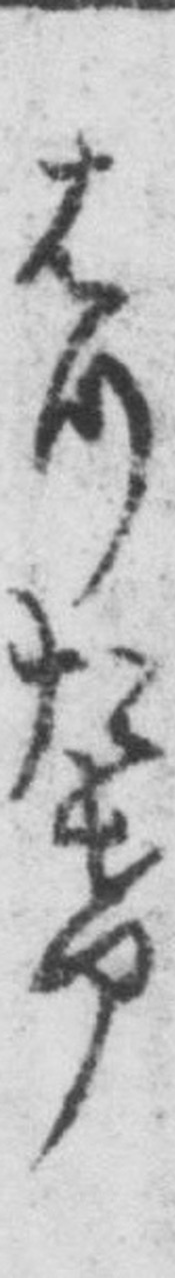はつたけ
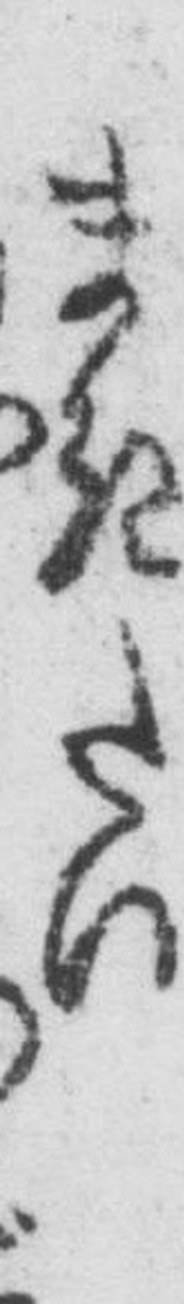まきたい
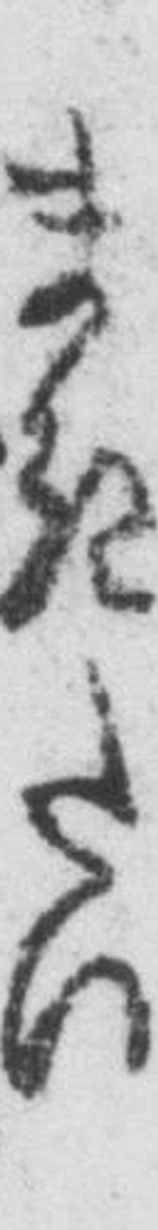まきたい
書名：即席庖丁
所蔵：大阪府立大学学術情報センター 国文学研究資料館
